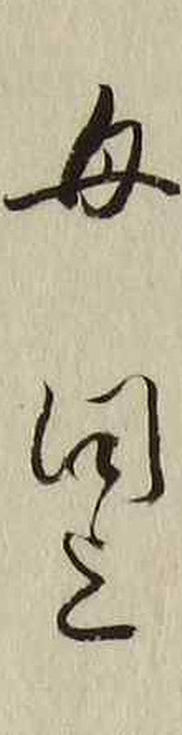母同上
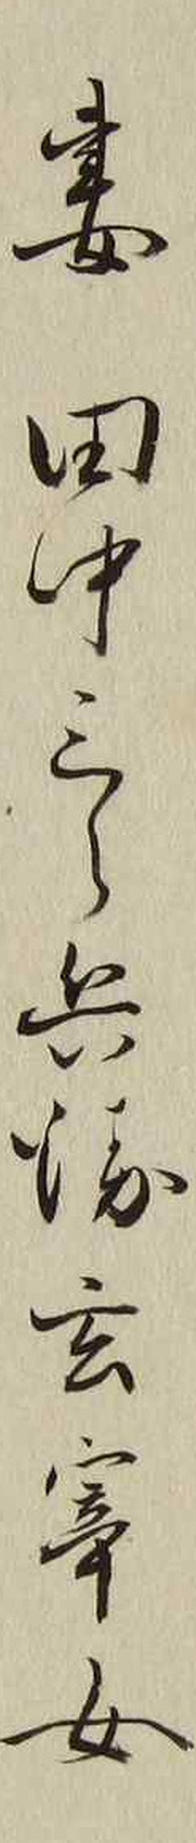妻田中三郎兵衛玄宰女
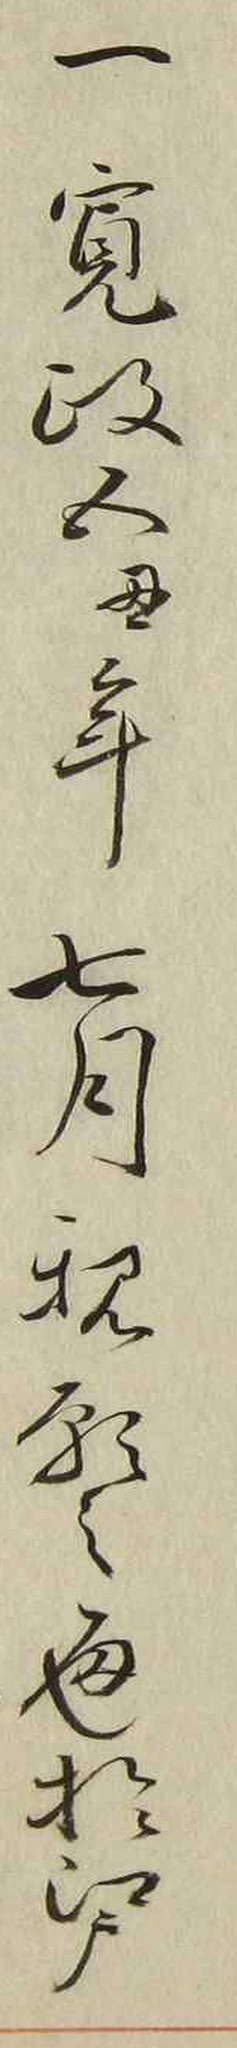一寛政五丑年七月親願之通於江戸

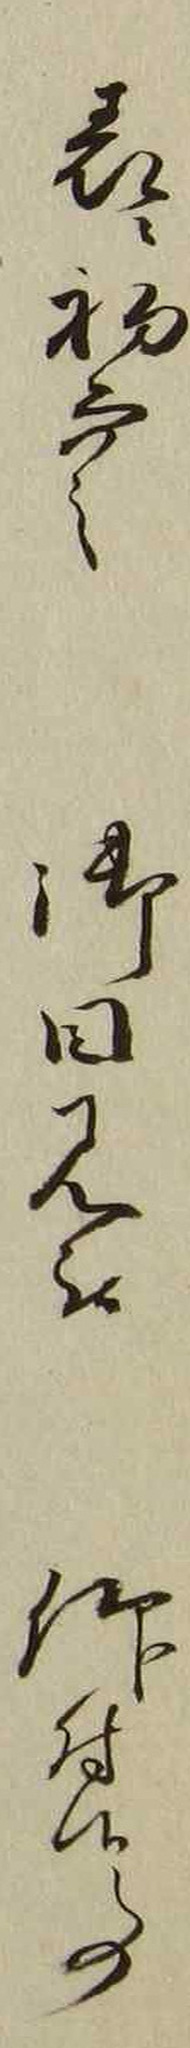表ニ初而之御目見被仰付候事
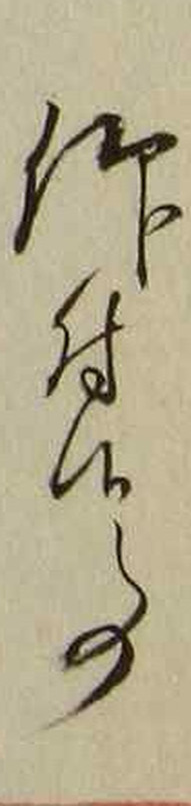仰付候事
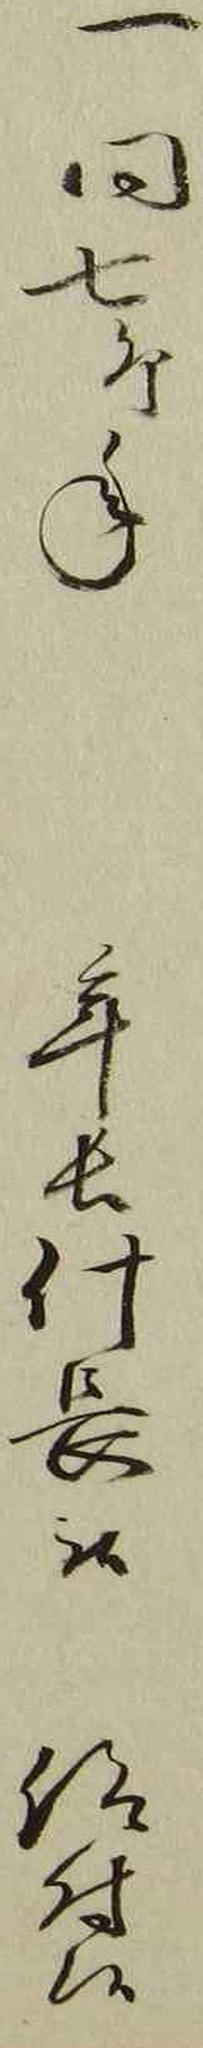一同七卯年年長什長被仰付候
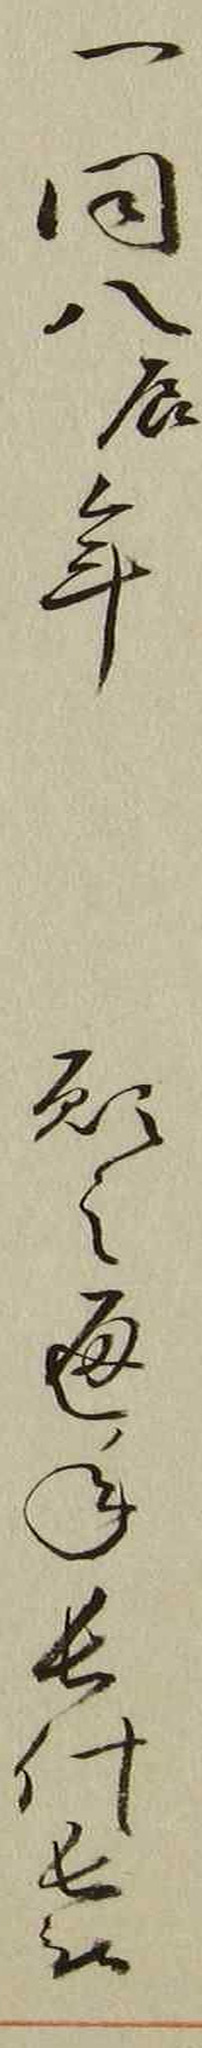一同八辰年願之通年長什長被
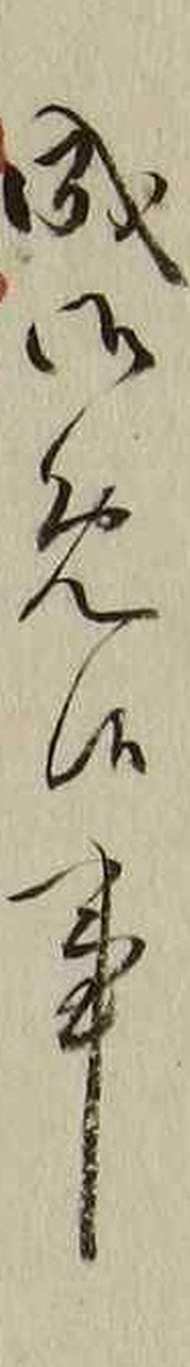成御免候事
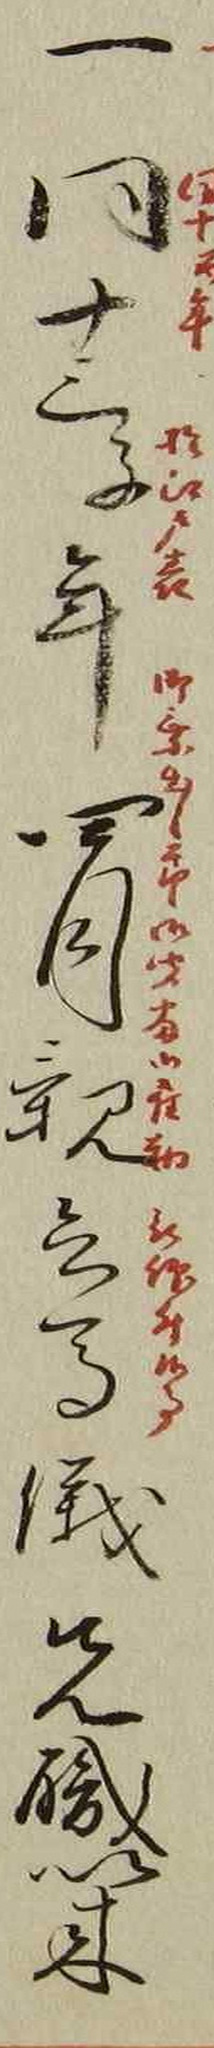一同十三子年四月親立馬儀先職以来
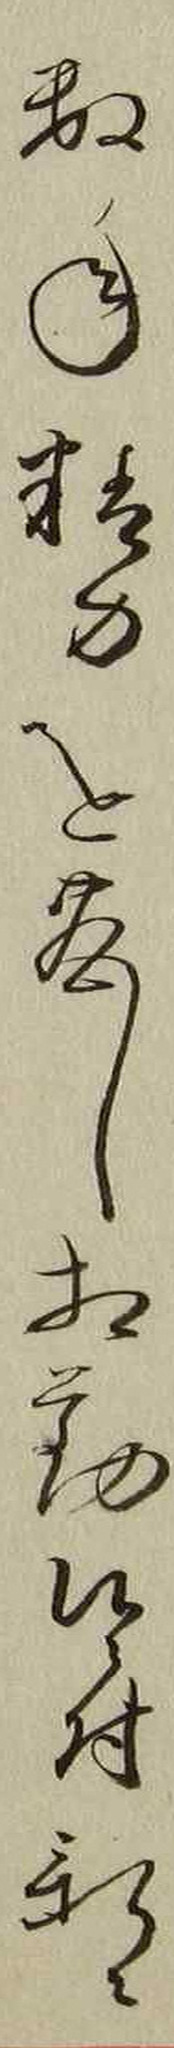数年精力を尽し相勤候ニ付新ニ
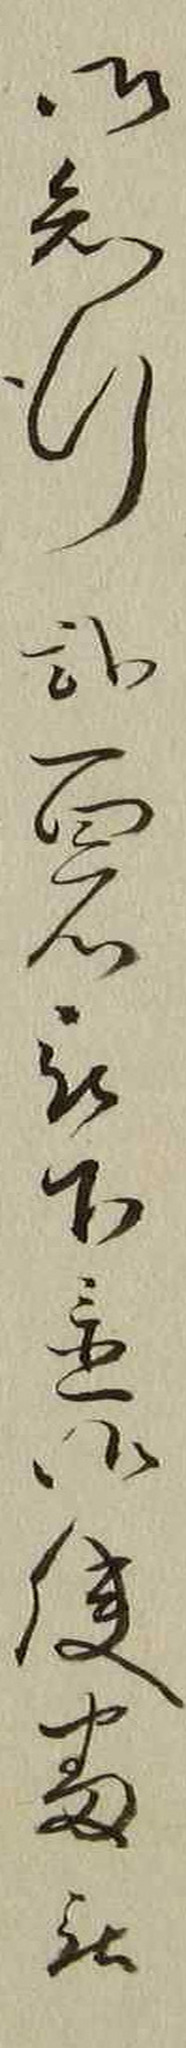御知行弐百石被下置御使番被
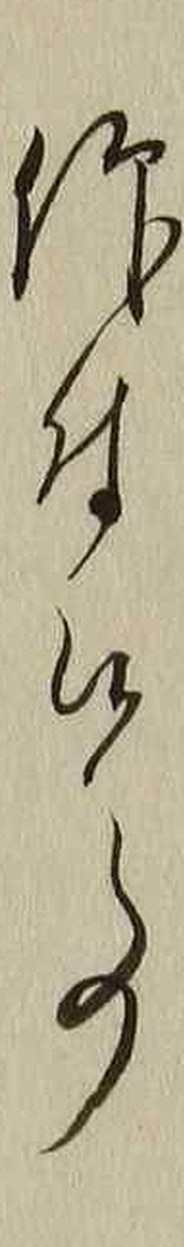仰付候事
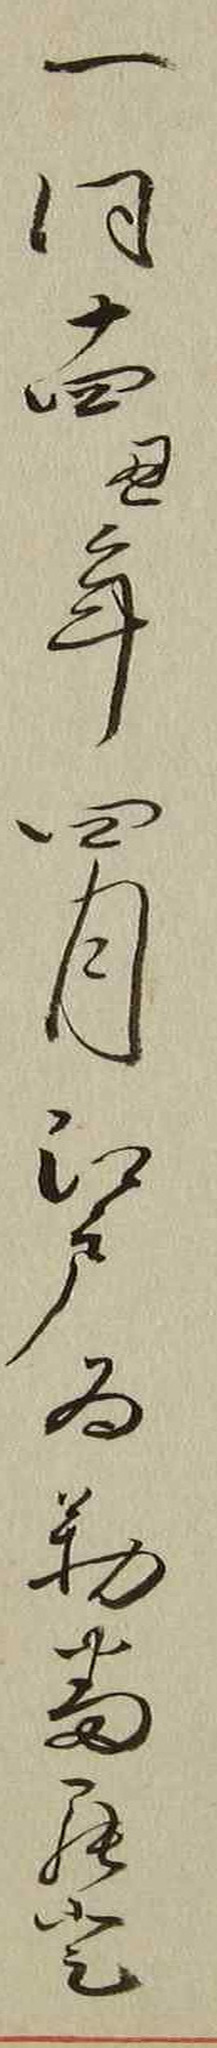一同十四丑年四月江戸為勤番罷登
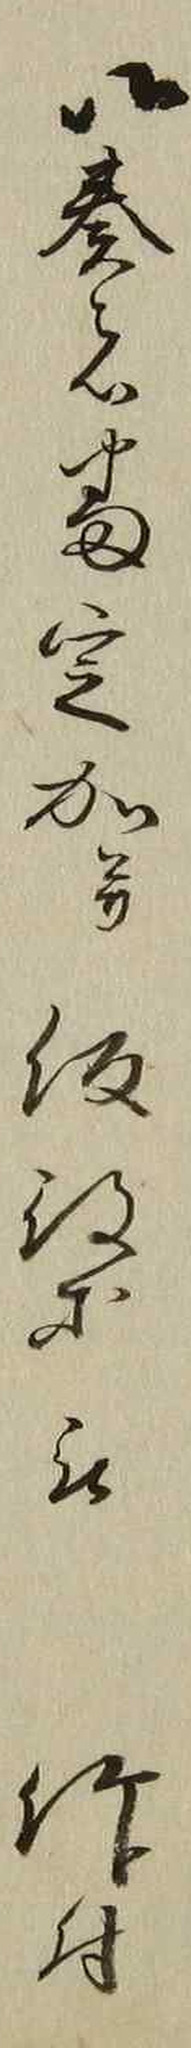御奏者番定加并仮役等被仰付
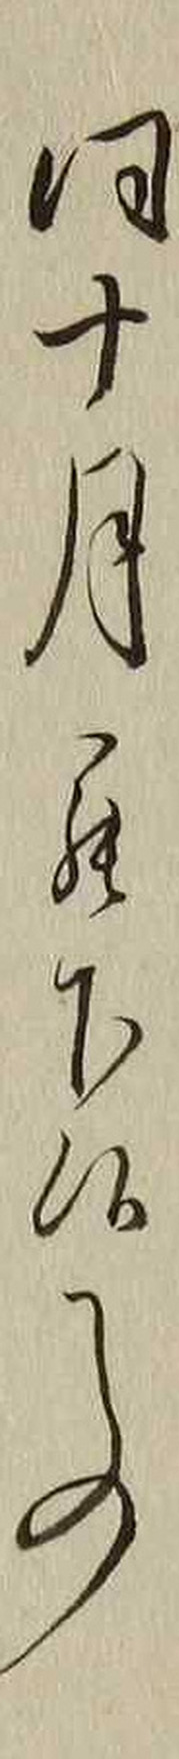同十月罷下候事
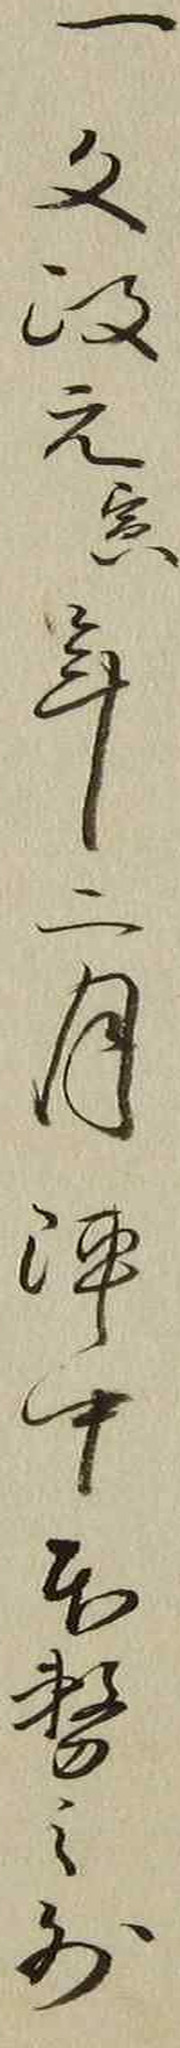一文政元寅年二月陣中本務之外
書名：諸士系譜　巻之2　い之部2
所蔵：会津若松市立会津図書館
